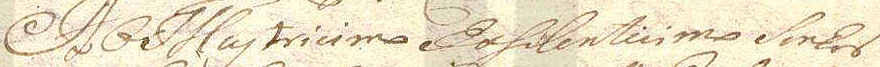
Ao Illustricimo Exselenticimo Senhor
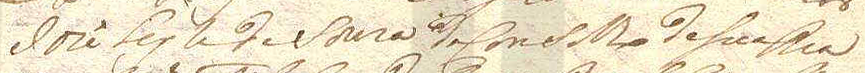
Iozé Leyte de Souza de Conselho de sua Ma
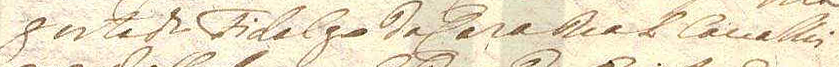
gestade Fidalgo da Caza Real Cauallei
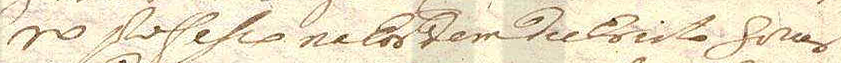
ro professo na hordem de christo Gouer
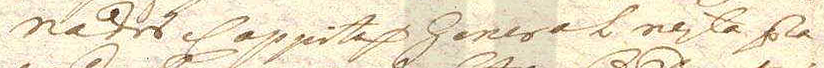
nador e Cappitaõ General nesta pRa
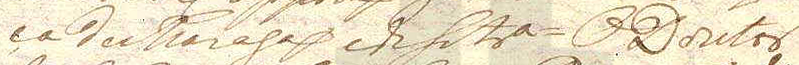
ça declaraçaõ edesetra = O Doutor
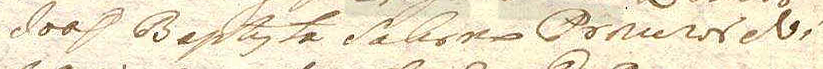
Ioaõ Baptista Salerno Prouezor e vi
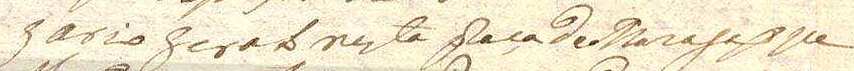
gario geral nesta pRaça de Mazagaõ pe
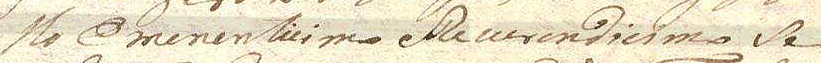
llo Emenenticimo e Reuerendicimo Se
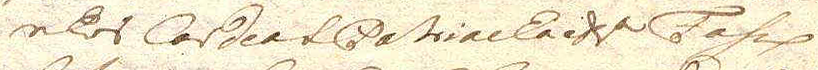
nhor CordeaL Patriacha e&a Fasso
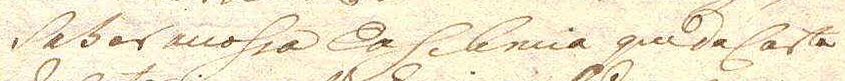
Saber a uossa Eceselencia que da Carta
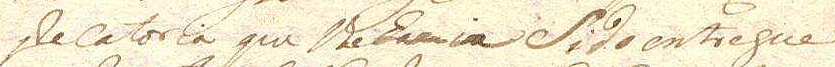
pRecatoria que lhe hauia sido entregue
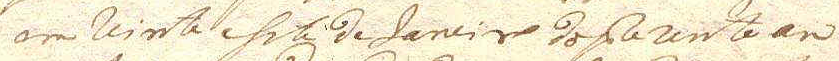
em vinte e sete de Ianeiro do pRezente an
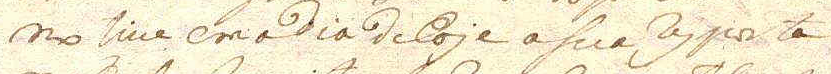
no tiue em o dia de hoje a sua Resposta
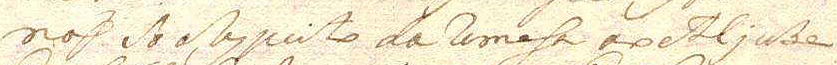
naõ só a Respeito da Remesa ao Aljube
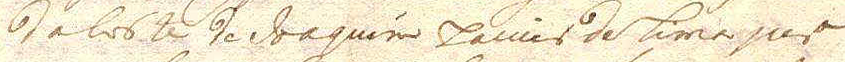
da Corte de Ioaquim Zauier de lima pera
